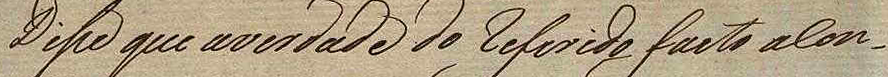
Disse que a verdade do Referido facto acon
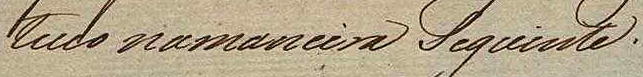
teceo na maneira seguinte.
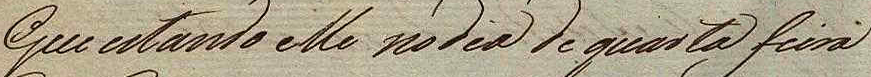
Que estando elle no dia de quarta feira
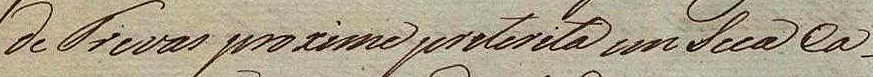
de Trevas proxima preterita em Sua ca
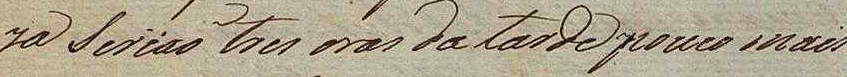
za Seriaõ tres oras da tarde pouco mais
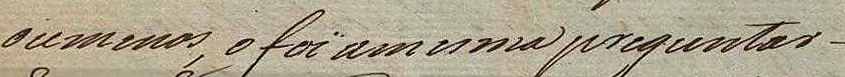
ou menos, o foi a mesma preguntar
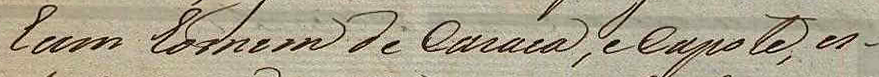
hum homem de cazaca, e capote, es
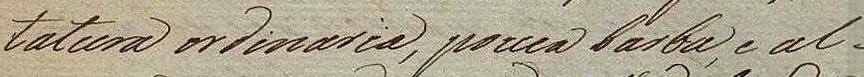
tatura ordinaria, pouca barba, e al
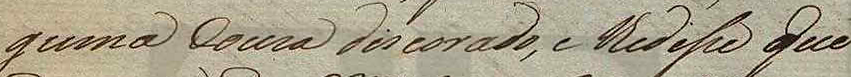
guma couza discorado, e lhe disse que
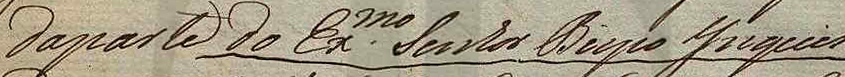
da parte do Ex.mo Senhor Bispo Jnquisi
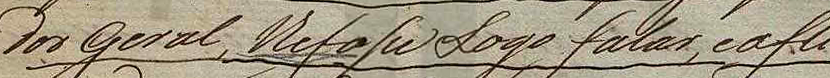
dor Geral, lhe fosse Logo falar, e afli
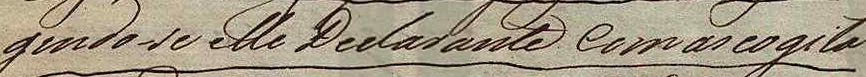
gendo-se elle Declarante com as cogita
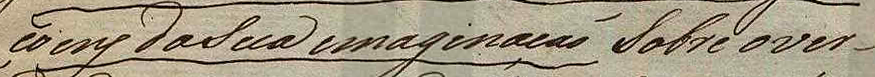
çoens da Sua emaginaçaõ Sobre o ver
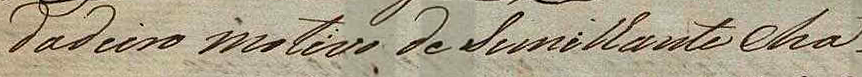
dadeiro motivo de Semilhante cha
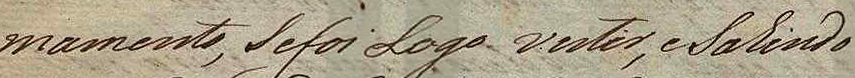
mamento, Se foi Logo vestir, e Sahindo
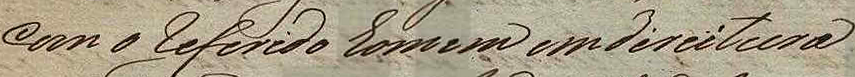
com o Referido homem em direitura
